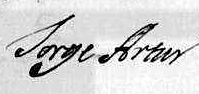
Iorge Artur
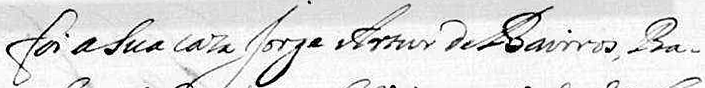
foi a sua caza Jorge Artur de Bairros, Ba
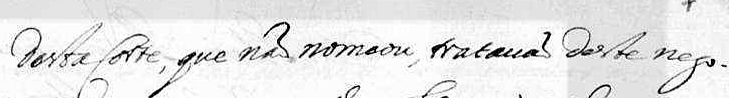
desta Corte, que naõ nomeou tratauaõ deste nego
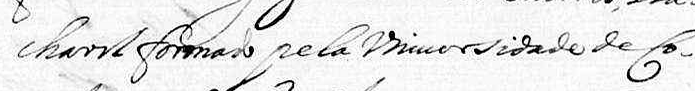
charel formado pela Vniuersidade de Co
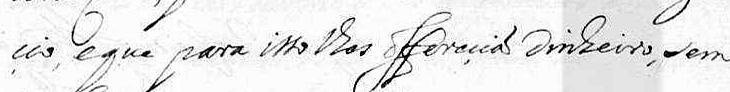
cio, e que para isso lhes offereciaõ dinheiro, sem
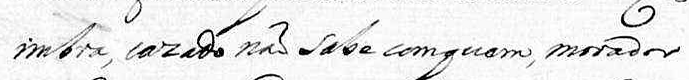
imbra, cazado naõ sabe com quem, morador
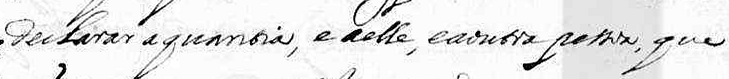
declarar a quantia, e a elle, e a outra pessoa, que
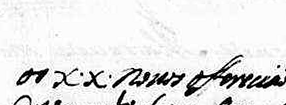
os x. x. nouos ofereciaõ
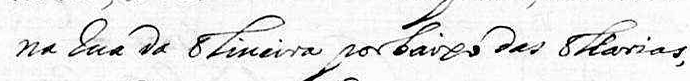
na Rua da oliueira por baixo das ollarias,
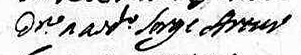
dr.o a ao d.o Iorge Artur
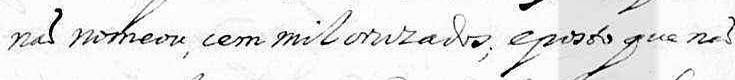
naõ nomeou, cem mil cruzados, e posto que naõ
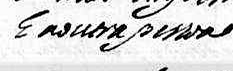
E a outra pessoa
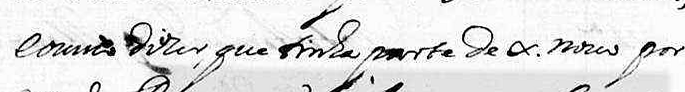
e ouuio dizer, que tinha parte de x. nouo por
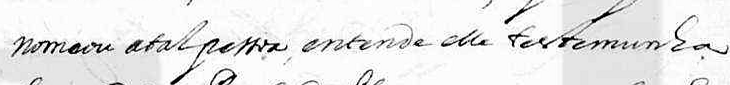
nomeou a tal pessoa, entende elle testemunha
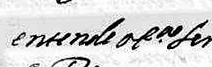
entende o t.a ser
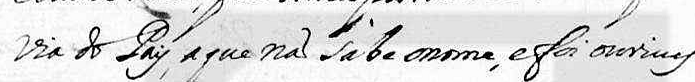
via do Pay, a que naõ sabe o nome, e foi ouriues
